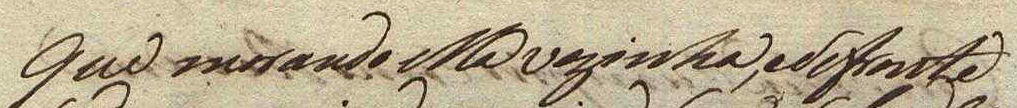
Que morando ella vezinha, e defronte
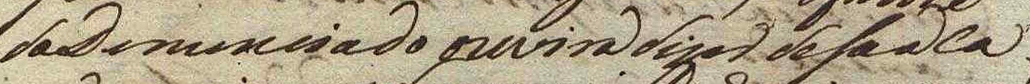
do Denunciado ouvira dizer de sua ca
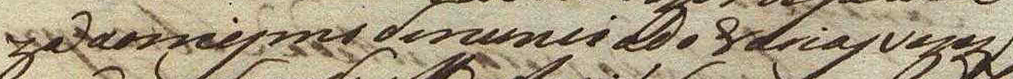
za ao mesmo denunciado Varias vezez
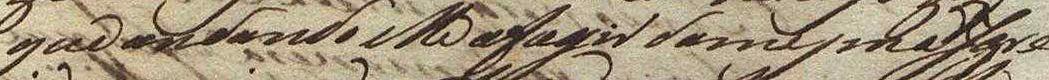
que andando elle a fugir da mesma Jgre
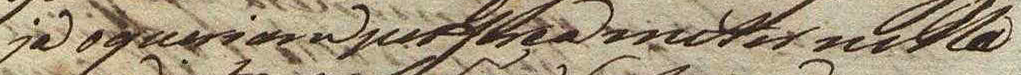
ja o queriam por força meter nella
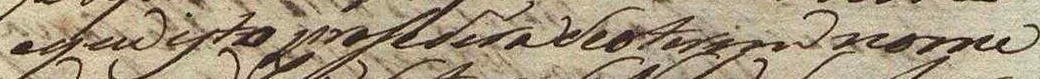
e que isto prosedera de o terem nome
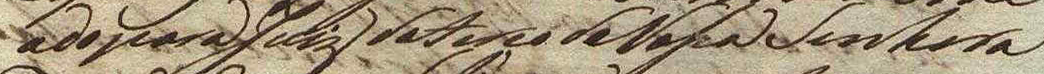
ado para Juiz do terço de Nossa Senhora
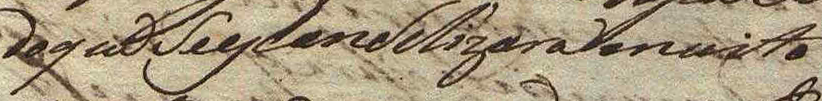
do que se escandelizara muito
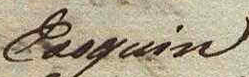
E ao quin
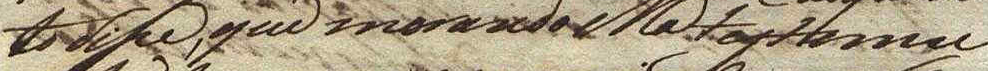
to disse, que morando ella testamu
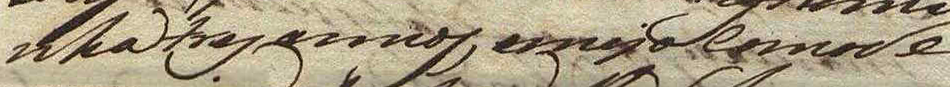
nha tres annos, e mejo com o de
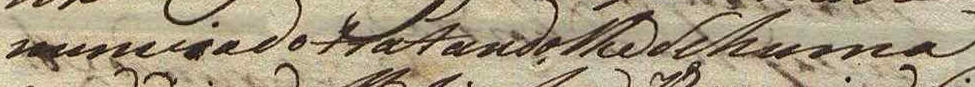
nunciado tratandolhe de huma
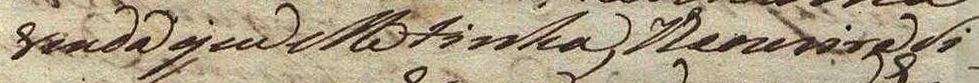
venda que elle tinha, lhe ouvira di
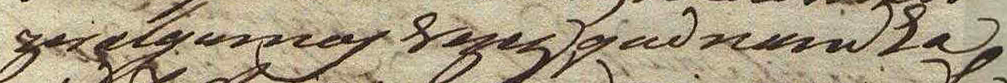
zer algumas Vezez, que nam ha
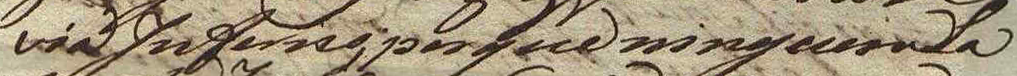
via Jnferno, porque ninguem La
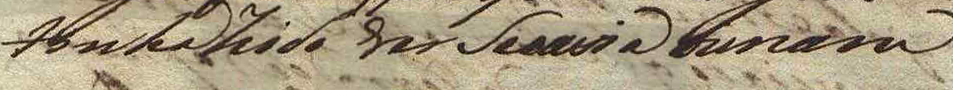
tinha hido ver Se avia ou nam
